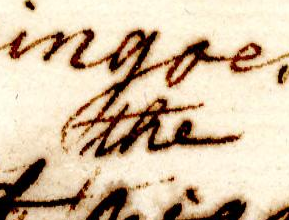the
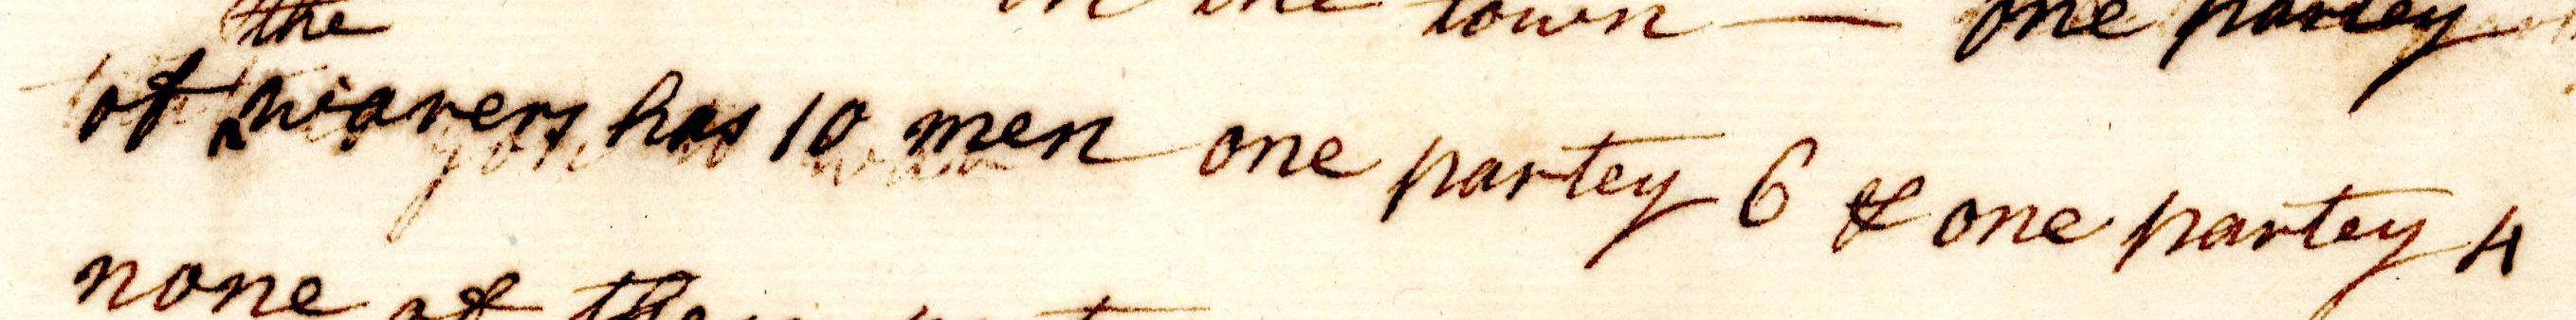of ^ warers has 10 men one partey 6 & one partey 4
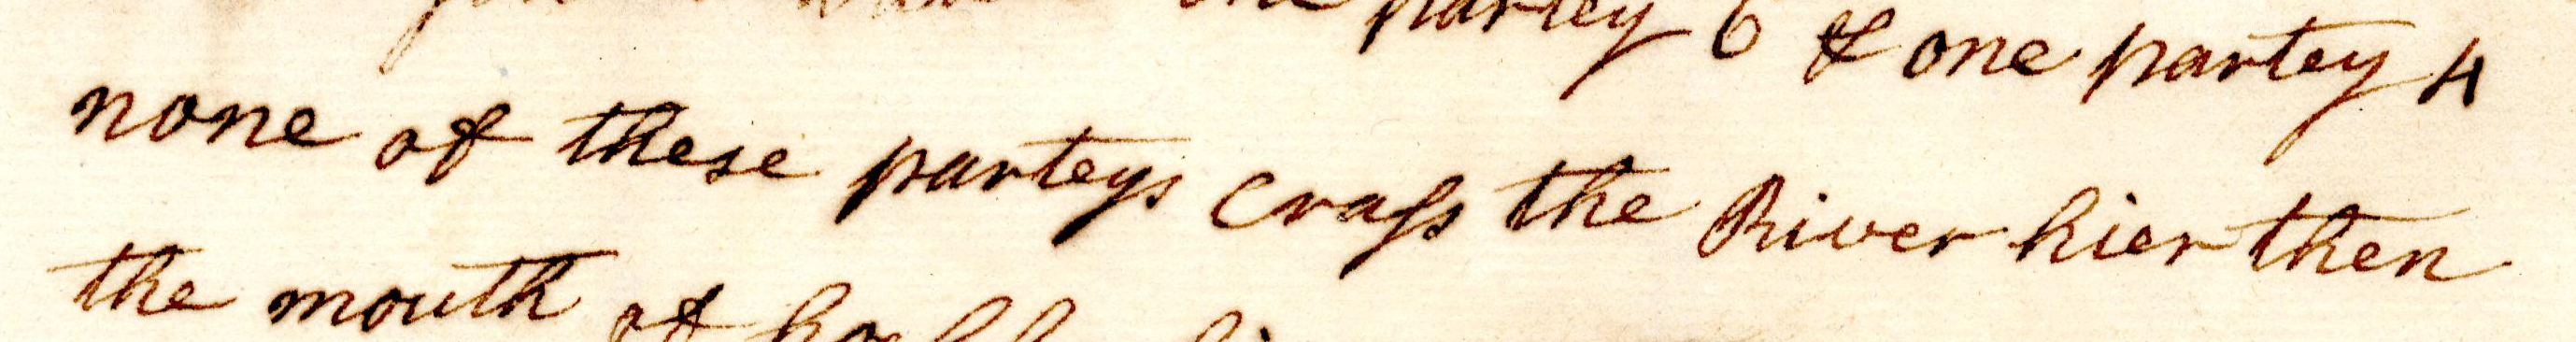none of these parteys crass the River hier then
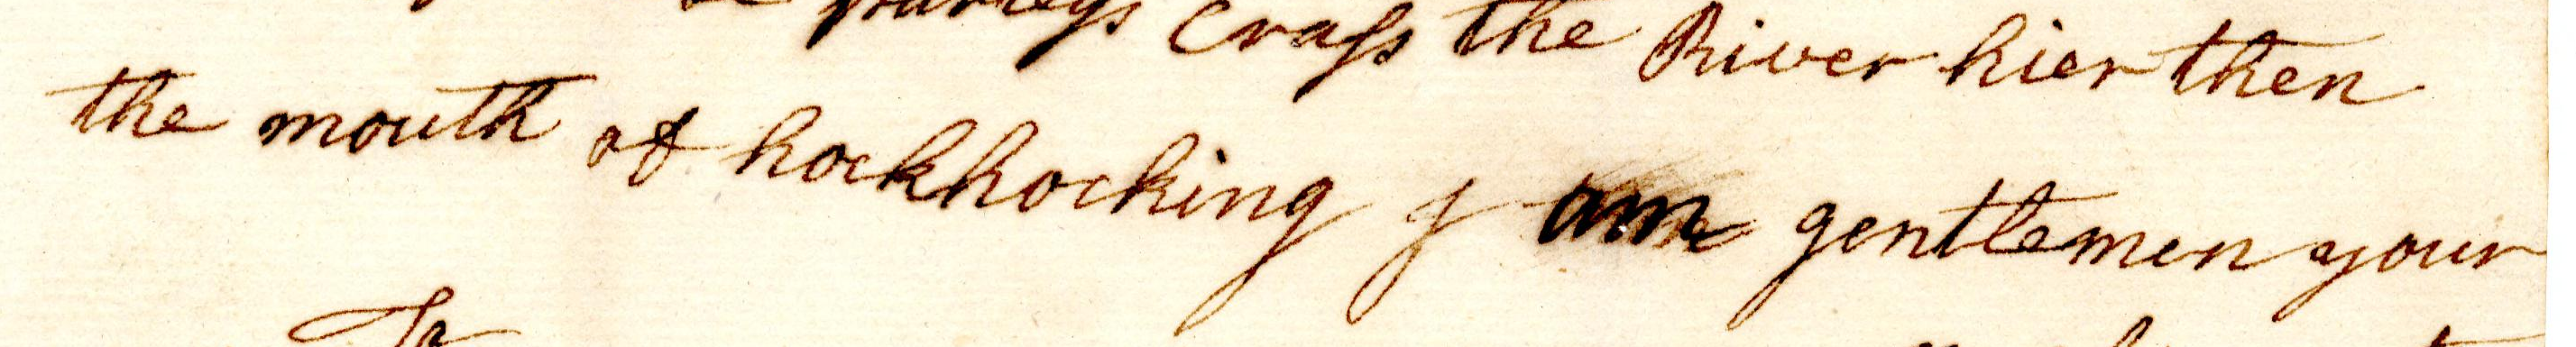the mouth of hockhocking I am gentlemen your
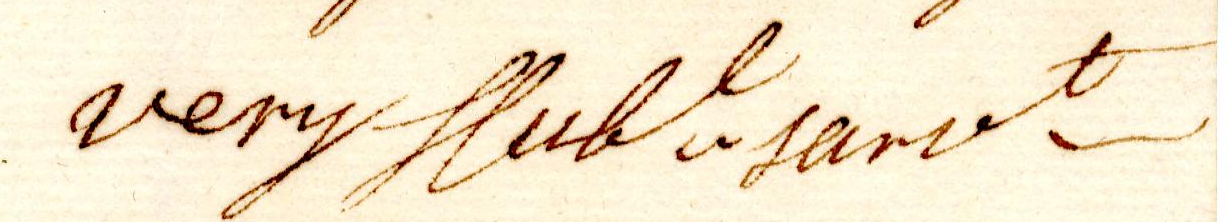very Hub^l sarv^t-
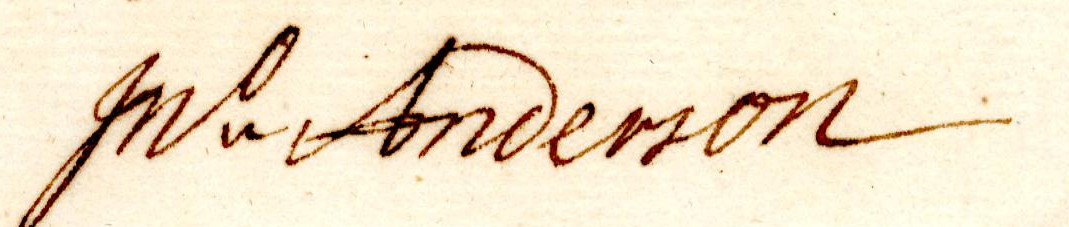Jn^o Anderson
